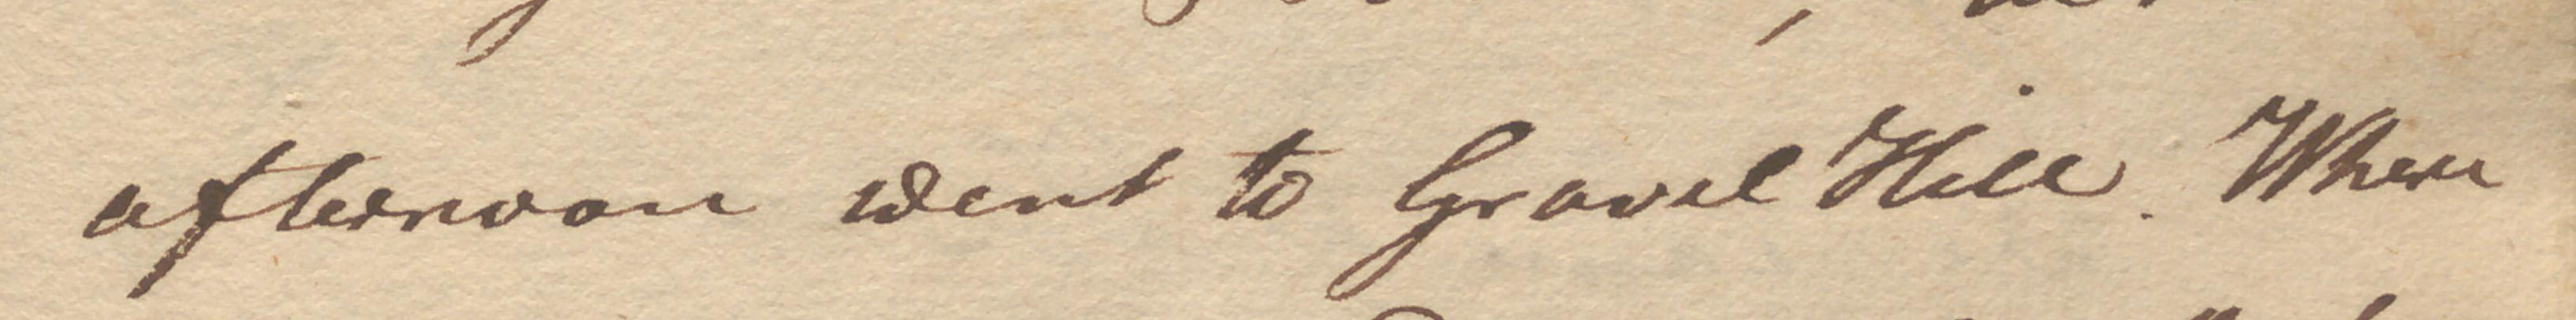afternoon went to Gravel Hill Where
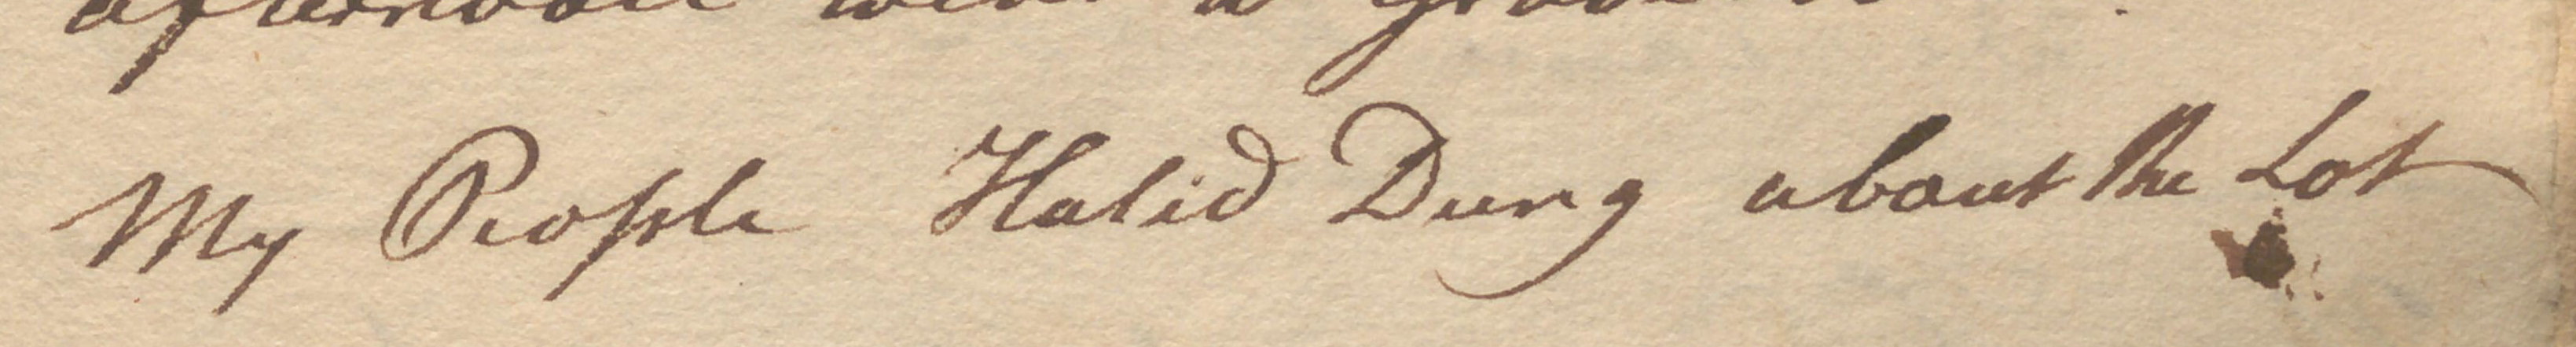My People Haled Dung about the Lot
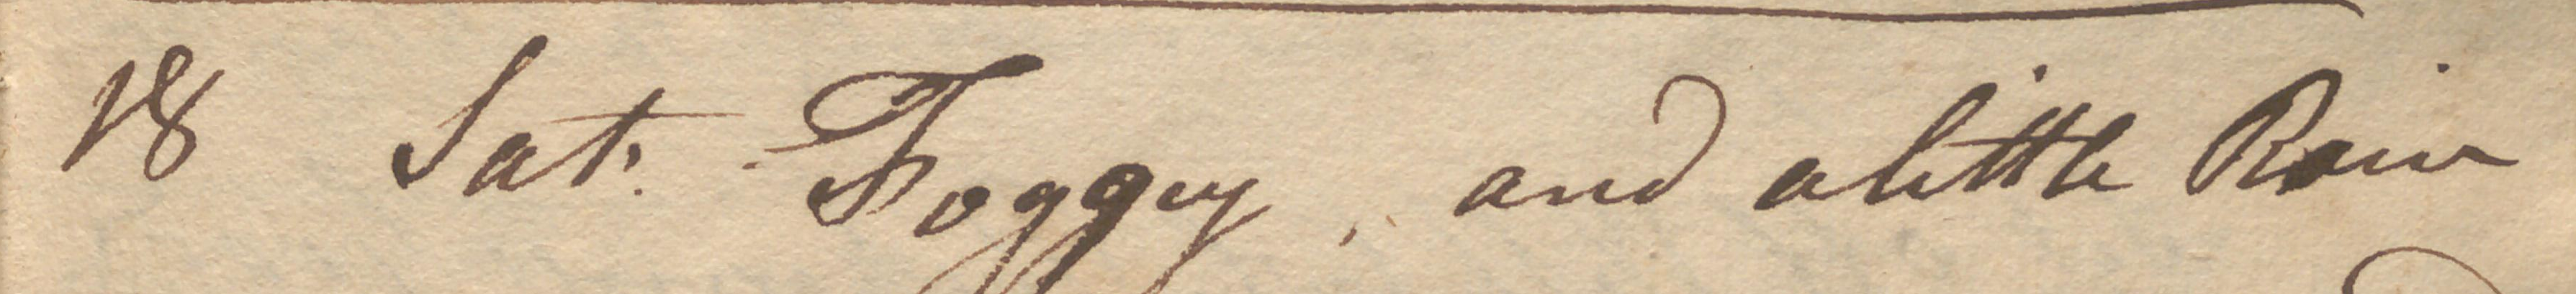18 Sat Foggey and a little Rain
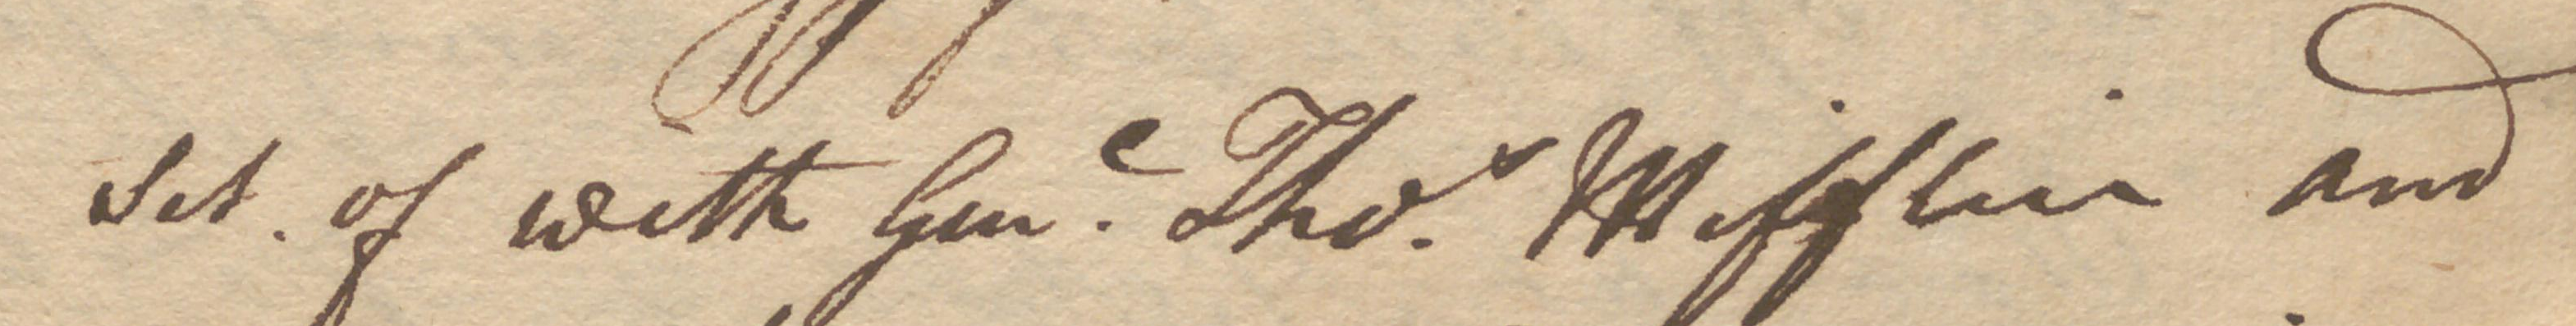set of with Gen^l. Tho^s. Mifflin and
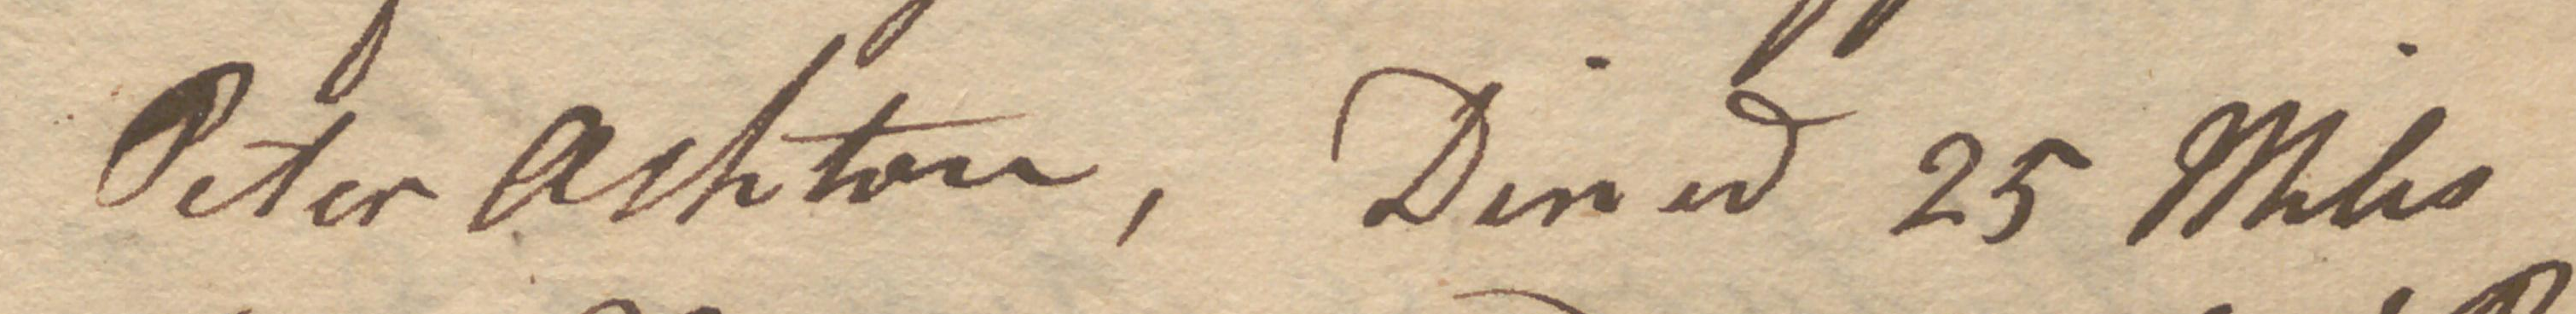Peter Ashton, Dined 25 Miles
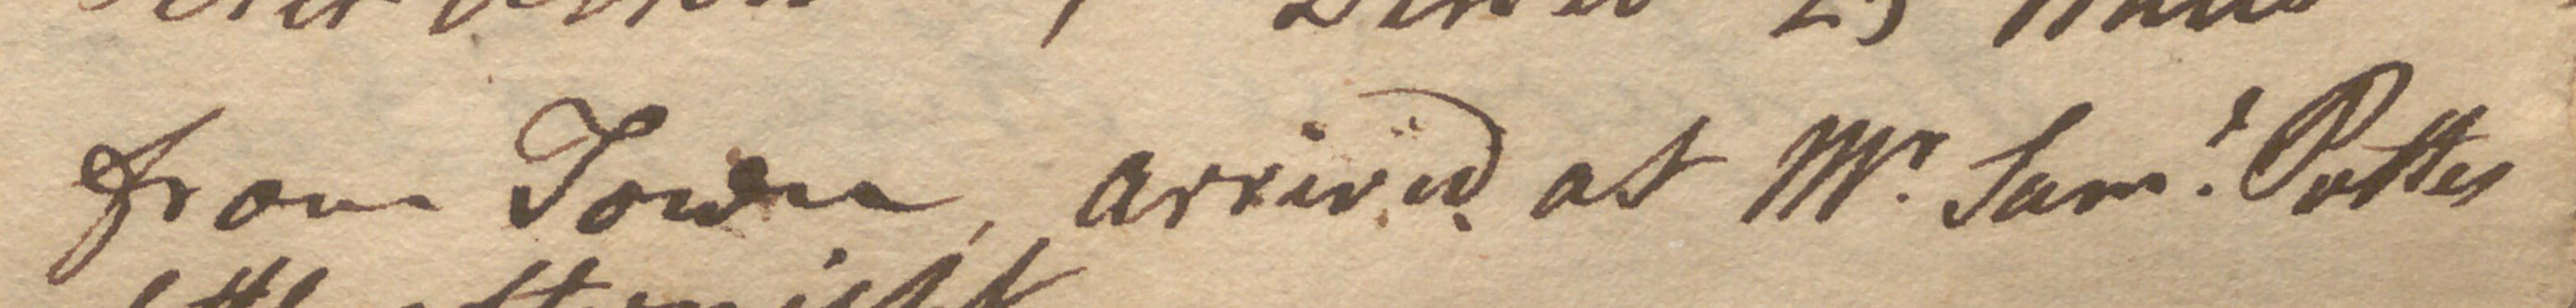from Town, arrived at M^r. Sam^l. Puttes
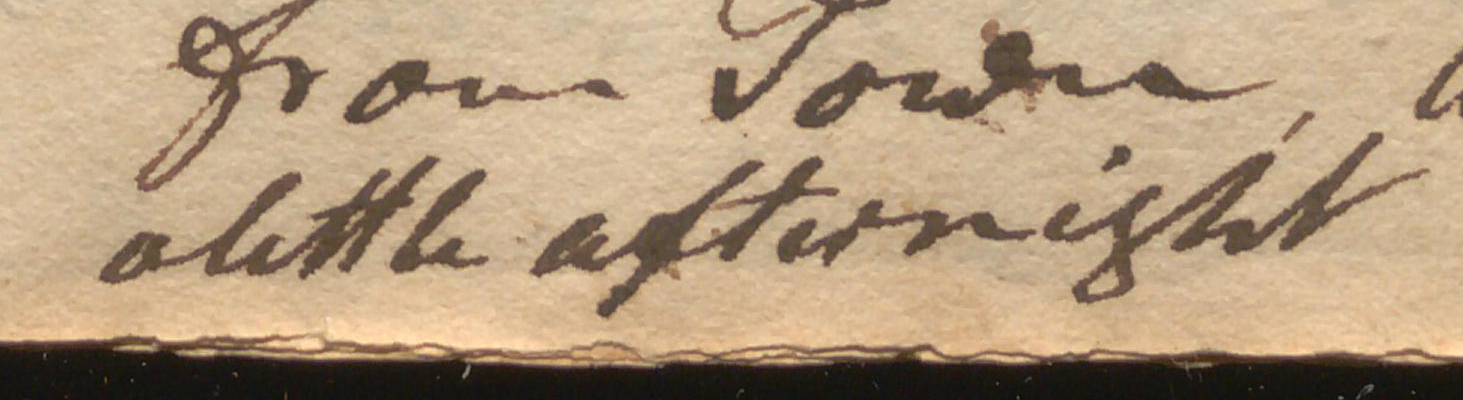a little afternight
